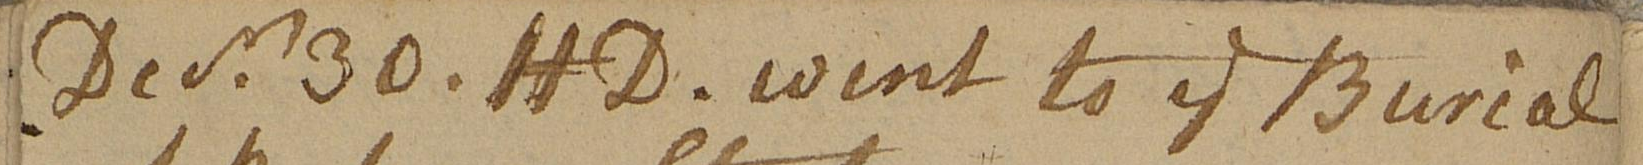Dec^r. 30. HD. went to y^e Burial
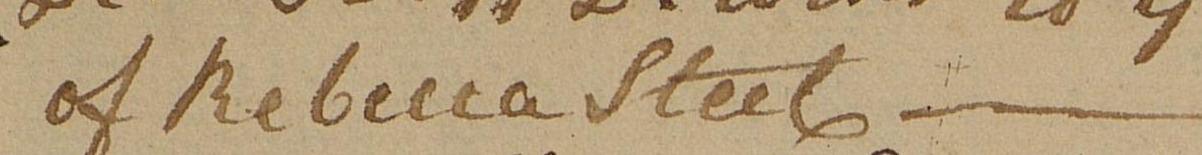of Rebecca Steel-
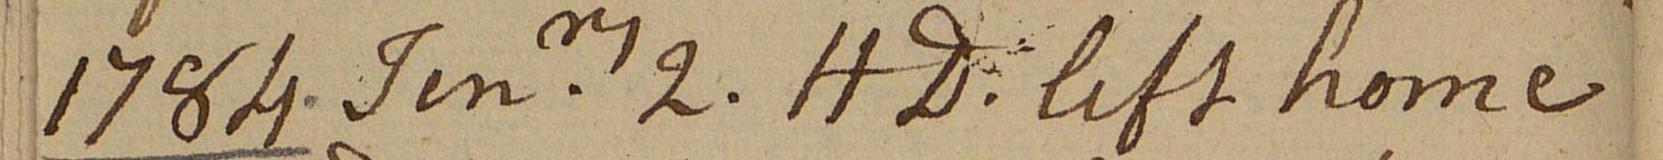1784 Jen^ry. 2 HD. left home
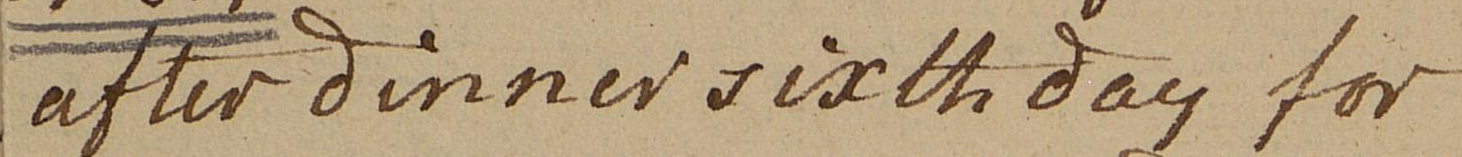after dinner sixth day for
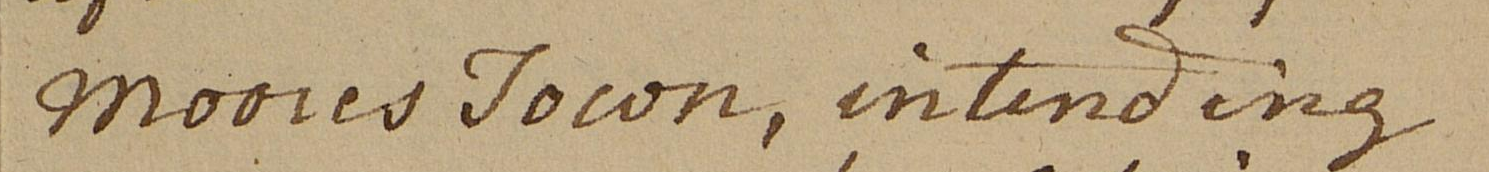Moores Town, intending
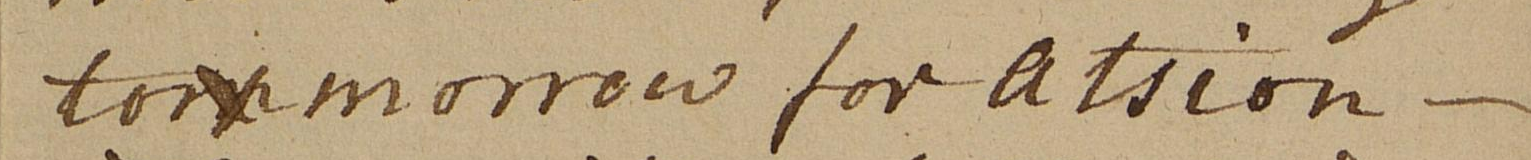tommorrow for Atsion-
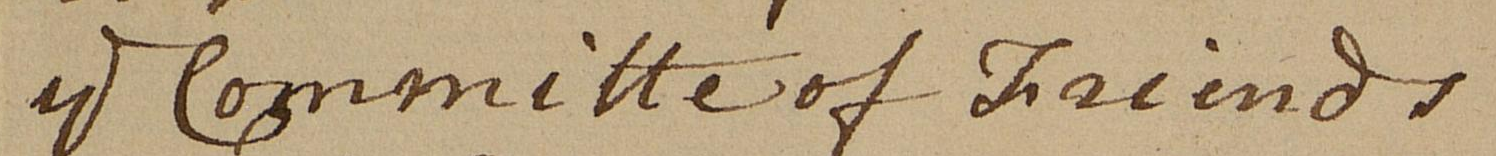y^e Committe of Friends
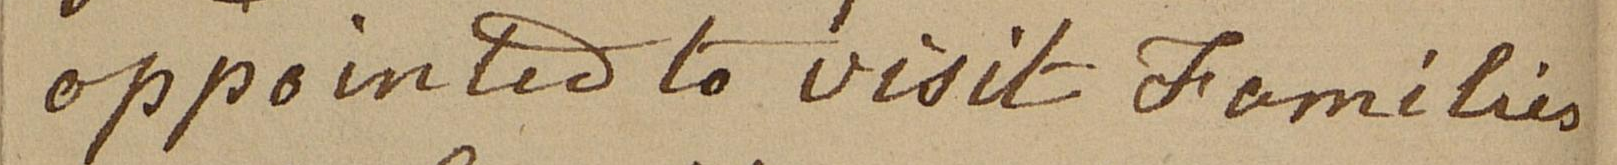oppointed to visit Families
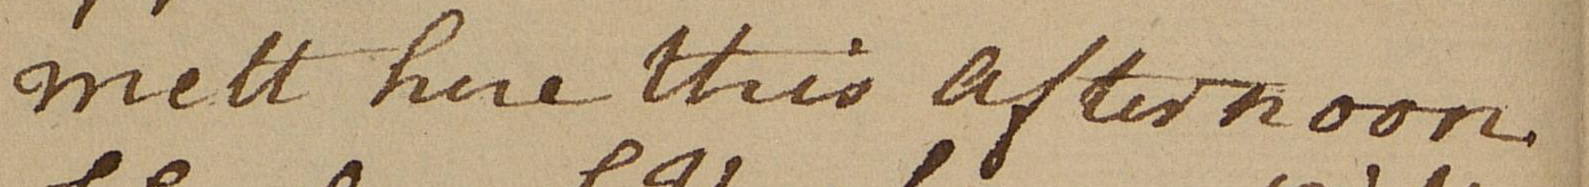mett here this Afternoon.
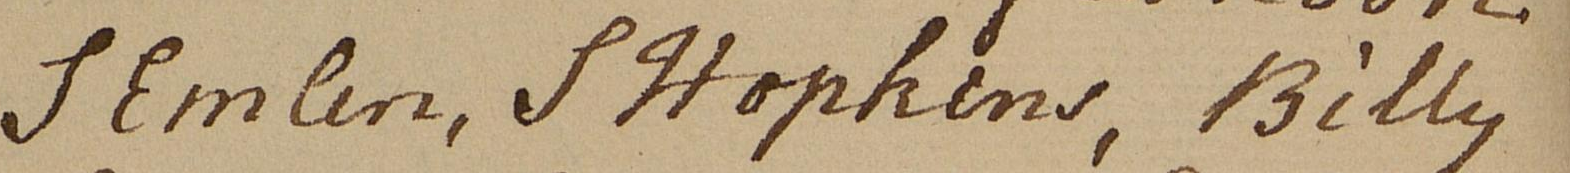S Emlen, S Hopkins, Billy
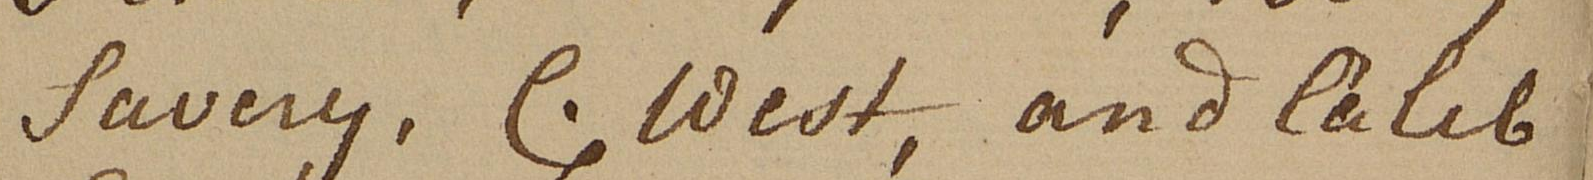Savery, C. West and Caleb
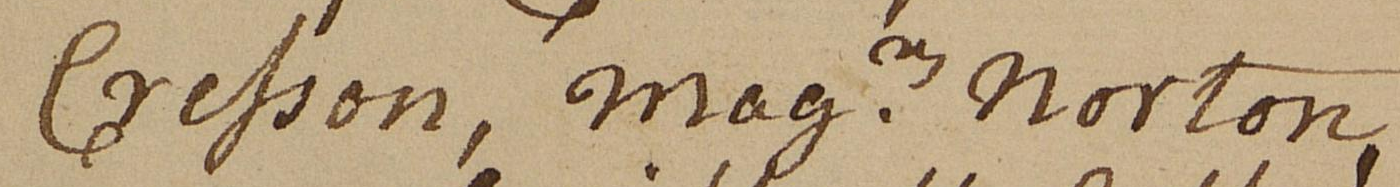Cresson, Mag^ry. Norton,
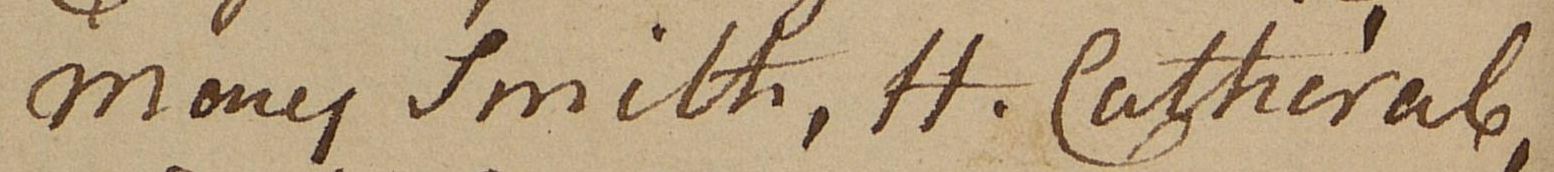Mony Smith, H. Catheral,
